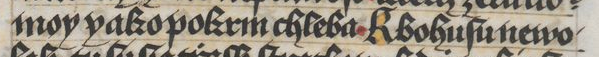moy yako pokrm chleba.K bohuſu newo¬
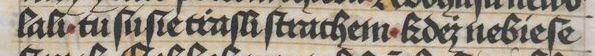lali.tu ſuſie tṙaſli ſtrachem.kdež nebíeſe
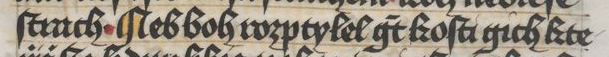ſtrach. Neb boh rozptylel ḡt koſti gich kte¬
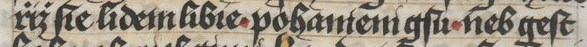ṙíż ſie lidem libíe.pohanieni gſu.neb geſt
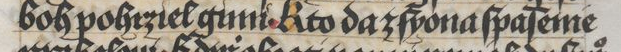boh pohrziel gimi.Kto da z ſyona ſpaſeníe
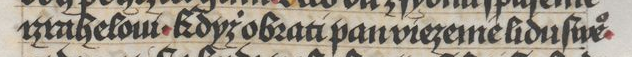izrahelouí.kdyż obratí pan viezeníe lidu ſwe°.
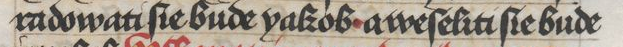radowati ſie bude yakob.a weſeliti ſie bude
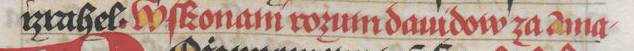izrahel.Wſkonaní rozum dauidow za Ama¬
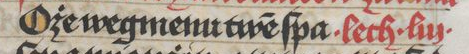Oże wegmenu twē ſpa.lech.liij.
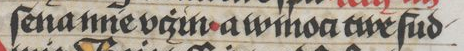ſena mie vcżin.a wmoci twe ſud¬
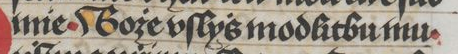mie.Bože vſlyṡ modlitbu mu.
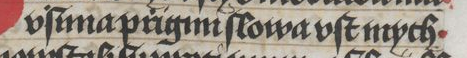vẛima přígmi ſlowa vſt mych.
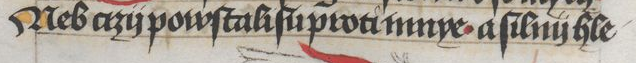Neb cizij powſtaliſu proti mnye.a ſilnij hle¬
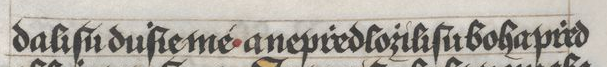daliſu duẛie mé.a nepṙedlożiliſu bohu pṙed
